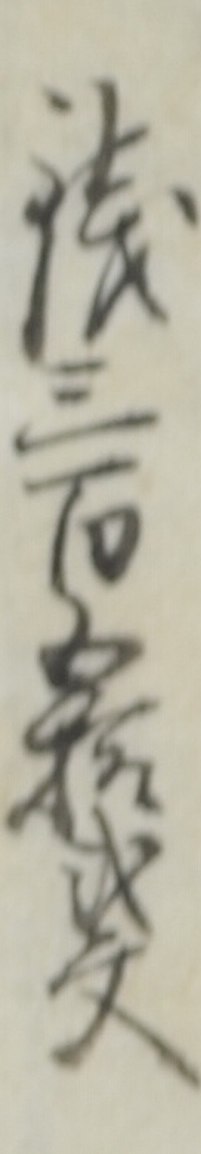銭三百五拾弐文
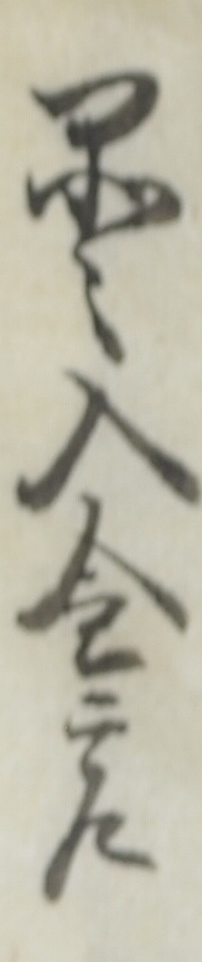品々入会宛
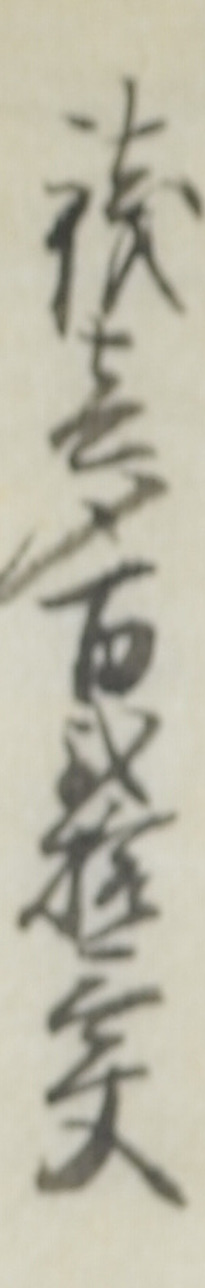銭壱〆百弐拾三文
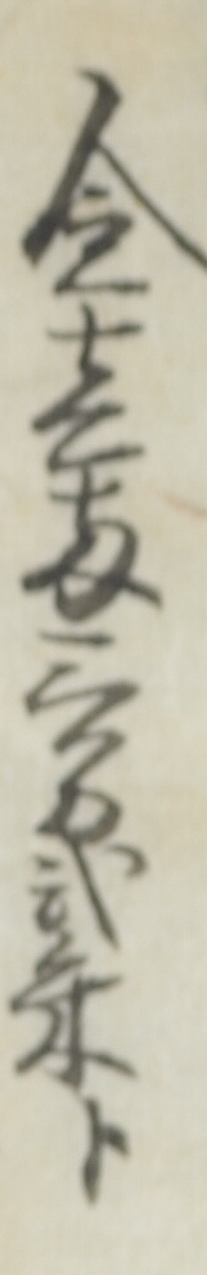金壱両三分弐朱ト
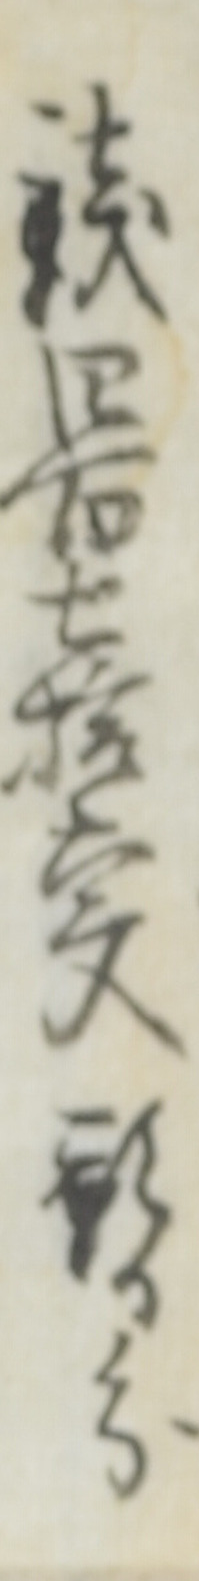銭四百七拾六文預り文
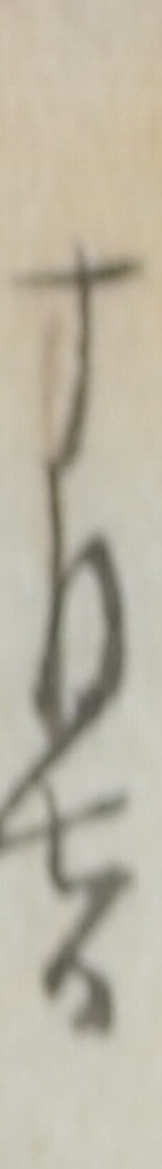十月七日

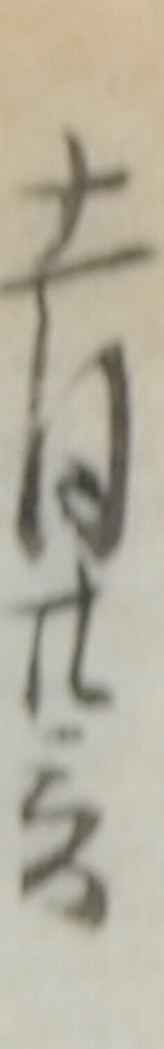十一月廿三日
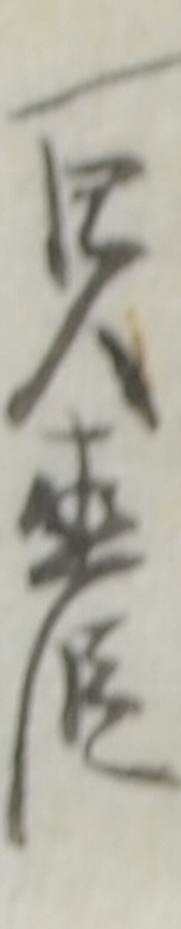四人直渡
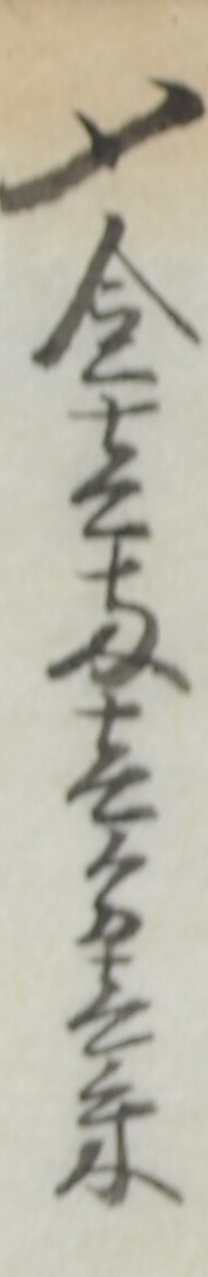〆金壱両壱分壱朱
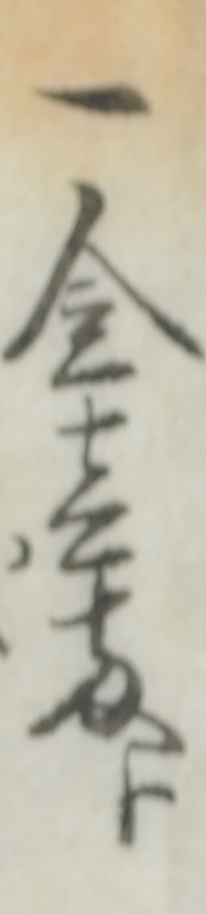一金壱両ト
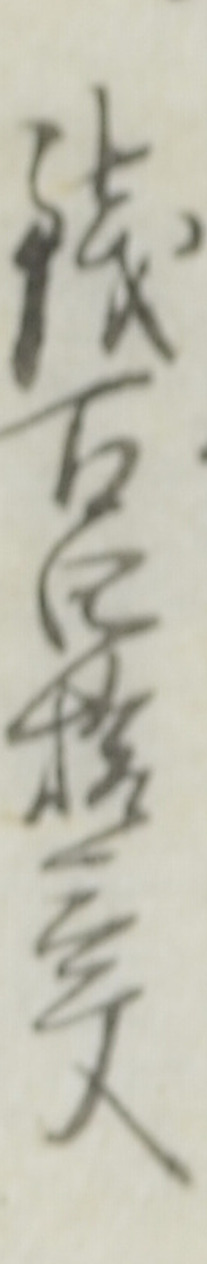銭百四拾三文
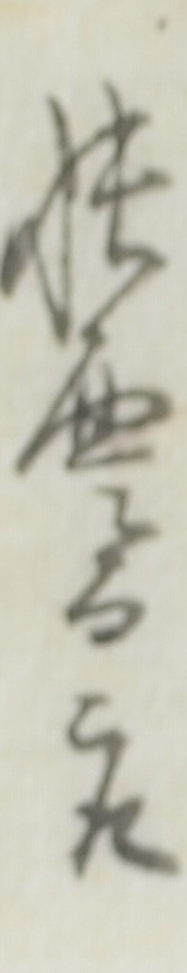帳面二而取

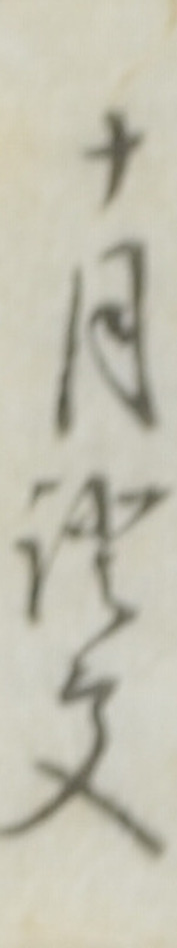十月証文
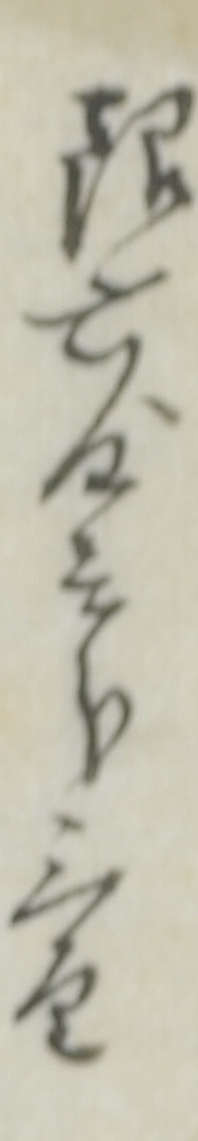銀六匁壱分三里
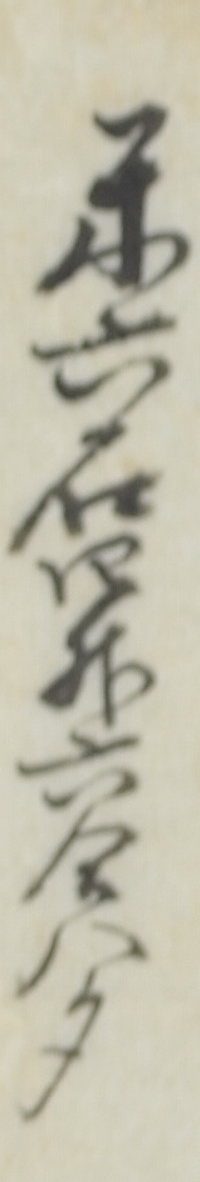一米六石四升六合八勺
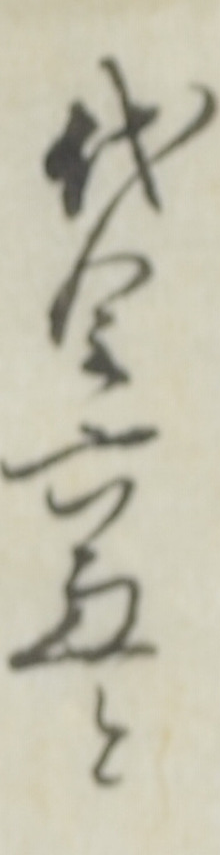代金六両と
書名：（金銭勘定抜書）
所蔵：伊那市立高遠町図書館・合同会社AMANE
